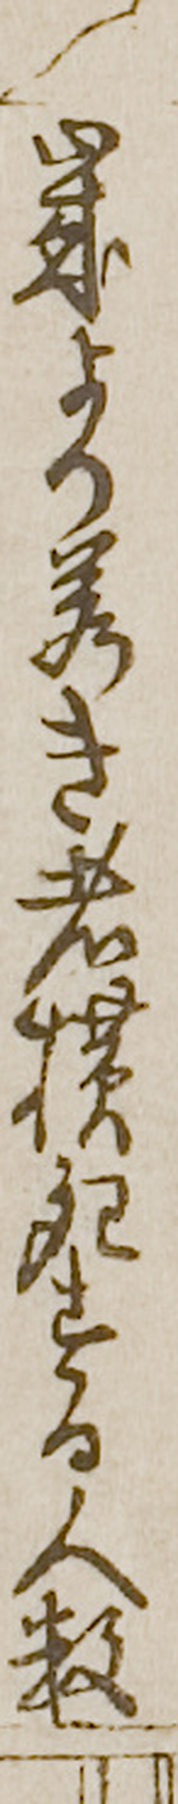歳より若き者横死する人数
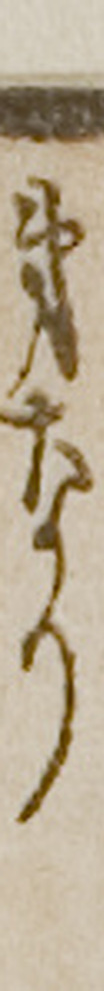第なり
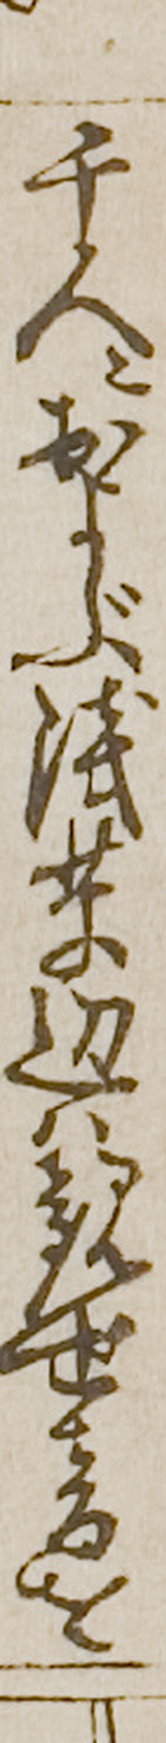千人におよぶ浅草辺は観世音を
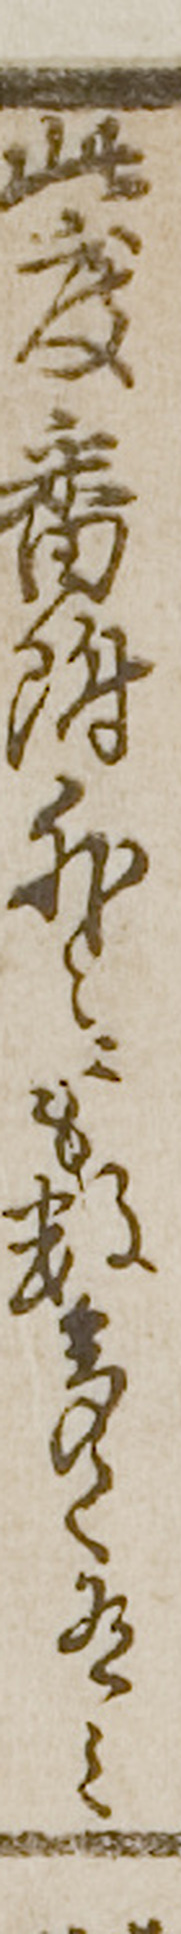此度番附外々にも数多く有之
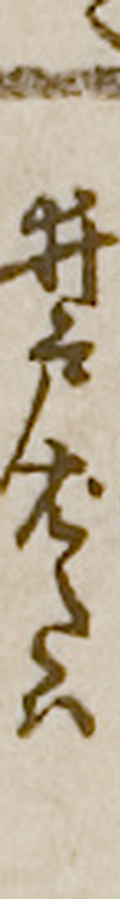井戸はたは
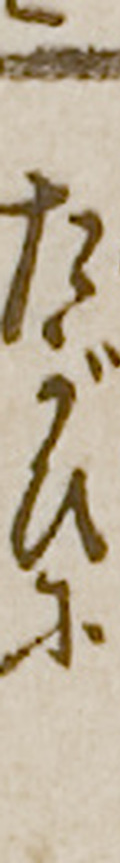たがひに
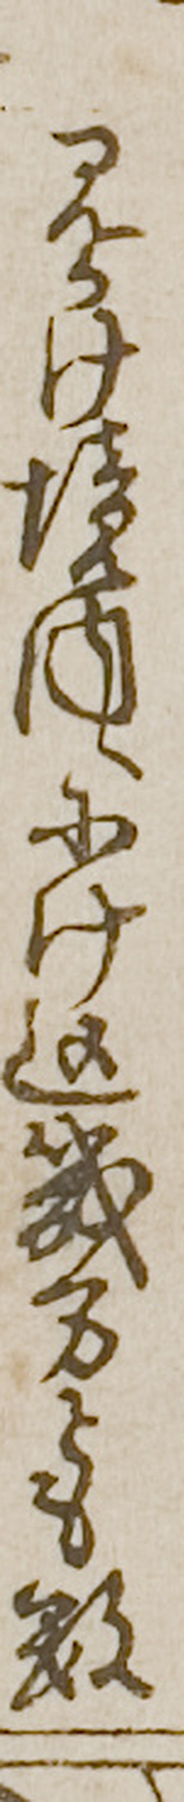見かけ境内へにけ込幾万とも数
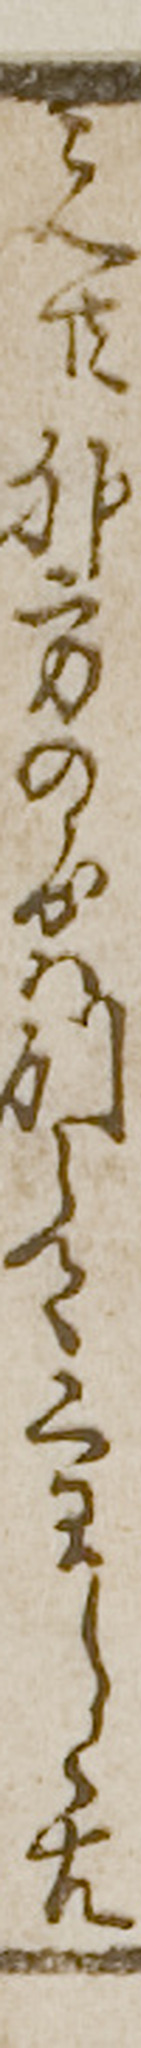候へ共外方の分は別してくわしくは
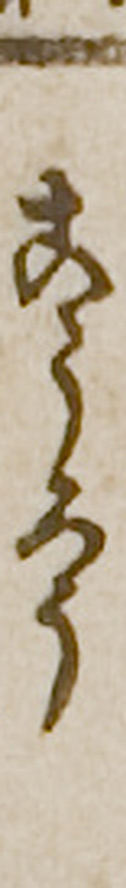こうろう
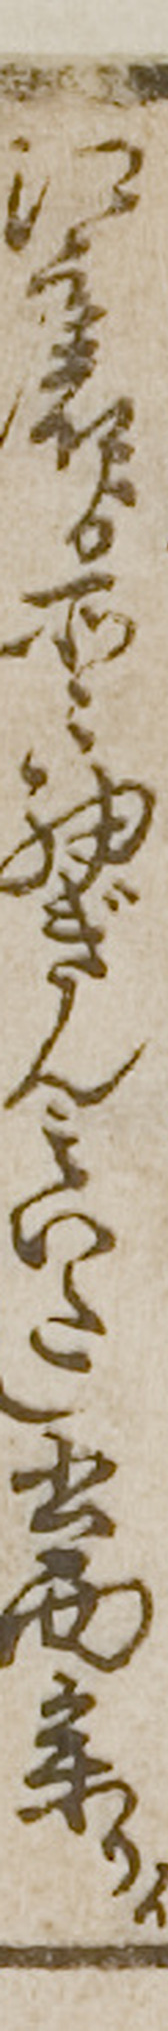江戸表ゟ所々細ぎんみいたし書面参り候
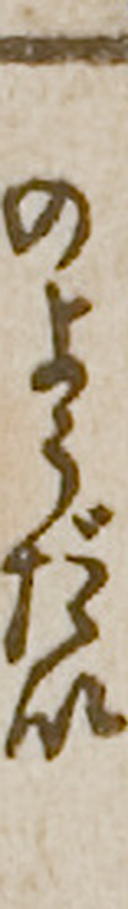のようだい
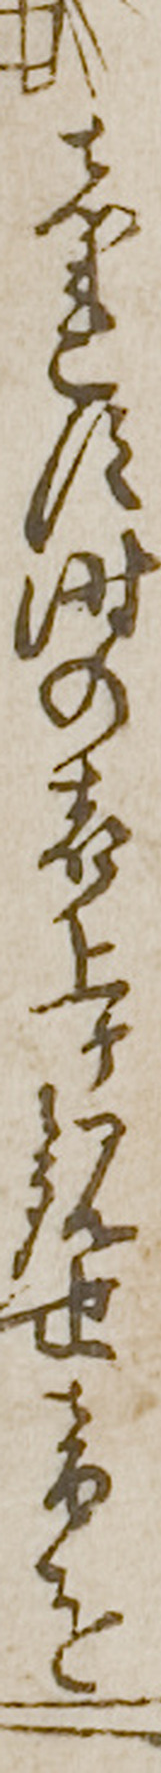しれす時の声上ヶ観世音を
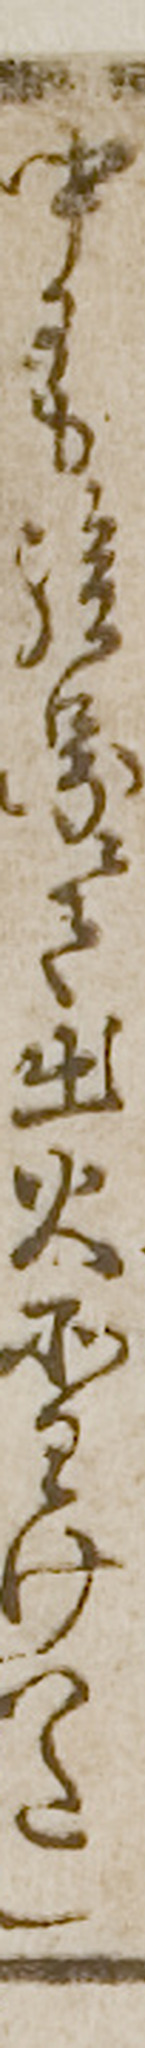中にも絵図にて出火所わけいたし
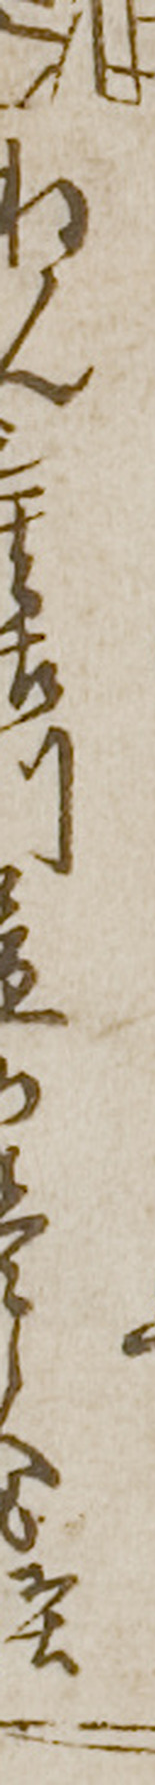ねんじ其御利益か壱人も怪
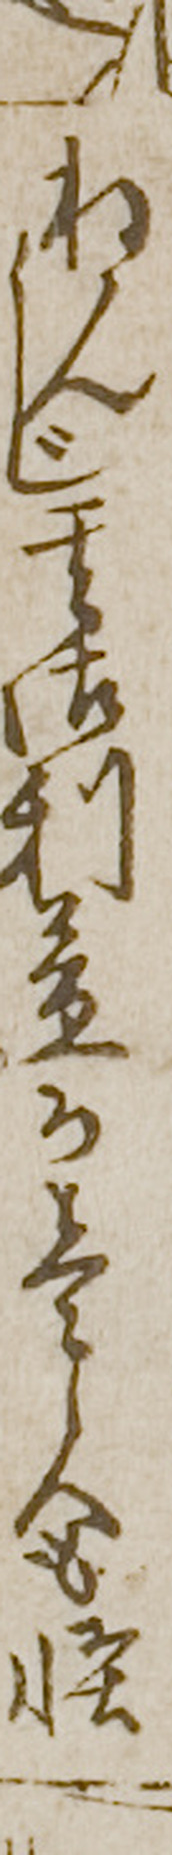ねんじ其御利益か壱人も怪
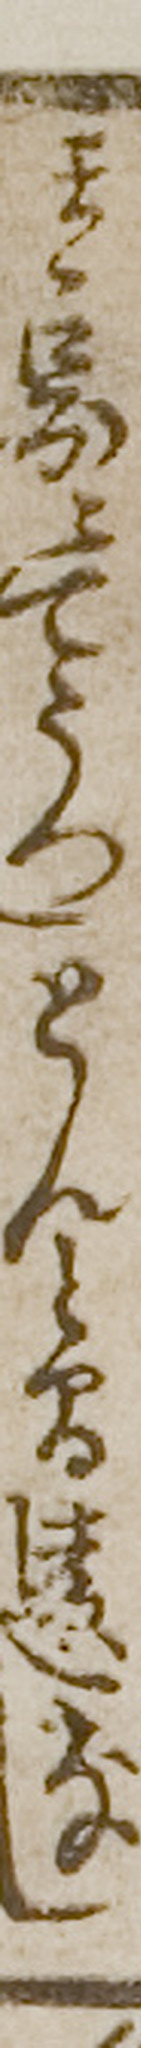其図上にてうつしとんと間違なし
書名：東都珍事実録咄
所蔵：東京大学総合図書館 General Library in the University of Tokyo, JAPAN
